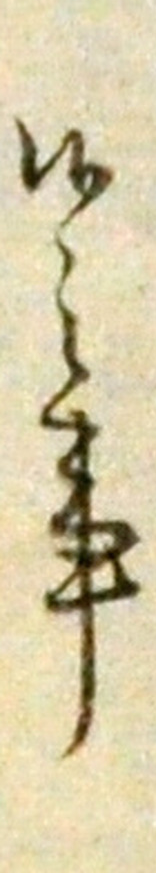候之事
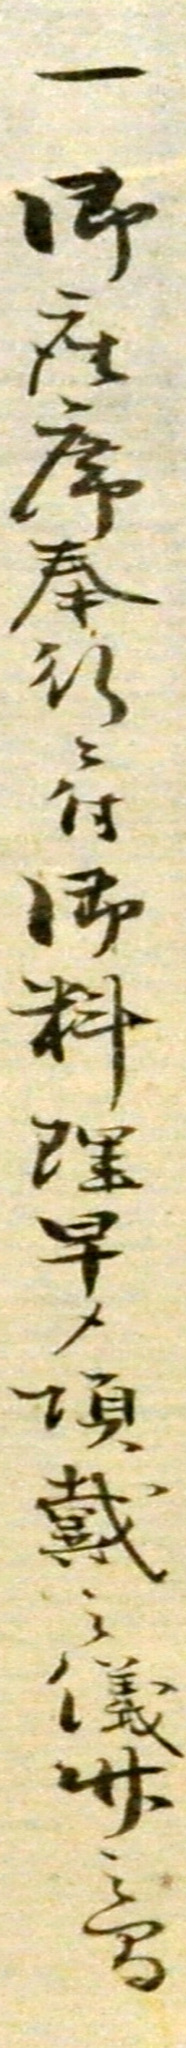一御座席奉行ニ付御料理早メ頂戴之儀竹之間
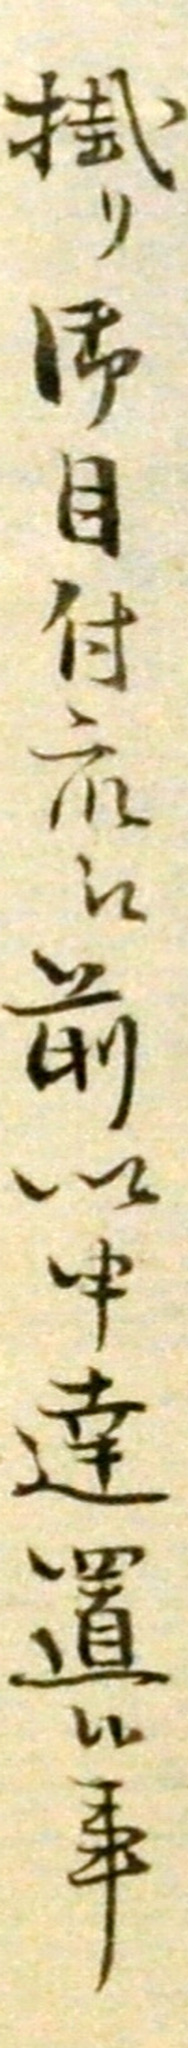掛り御目付衆え前以申達置候事
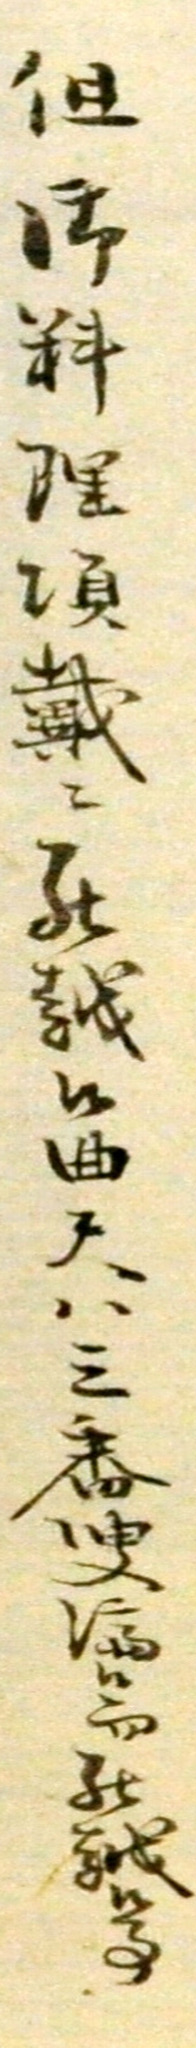但御料理頂戴ニ罷越候ハ三番叟済候而罷越候事

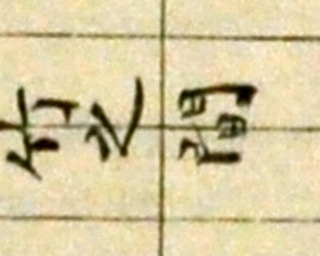竹之間
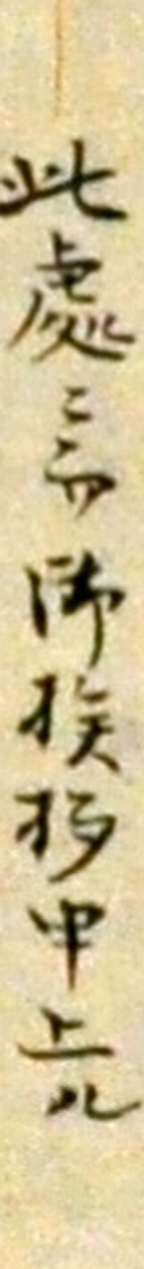此處ニ而御挨拶申上ル
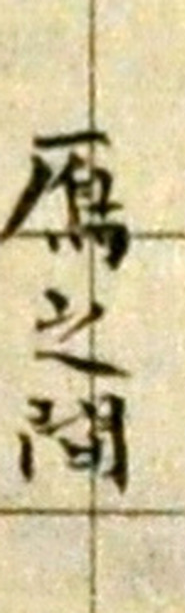雁之間
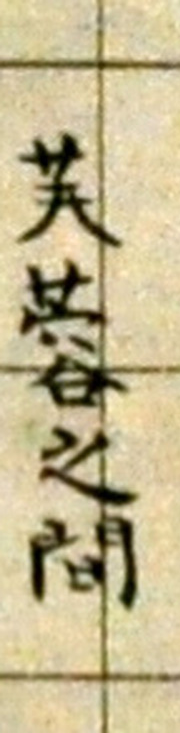芙蓉之間
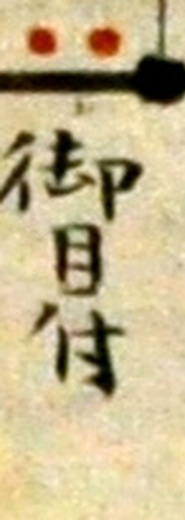御目付
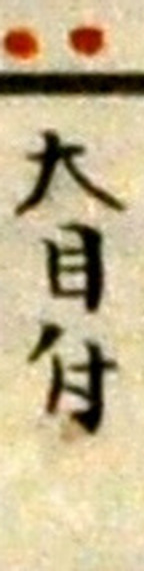大目付

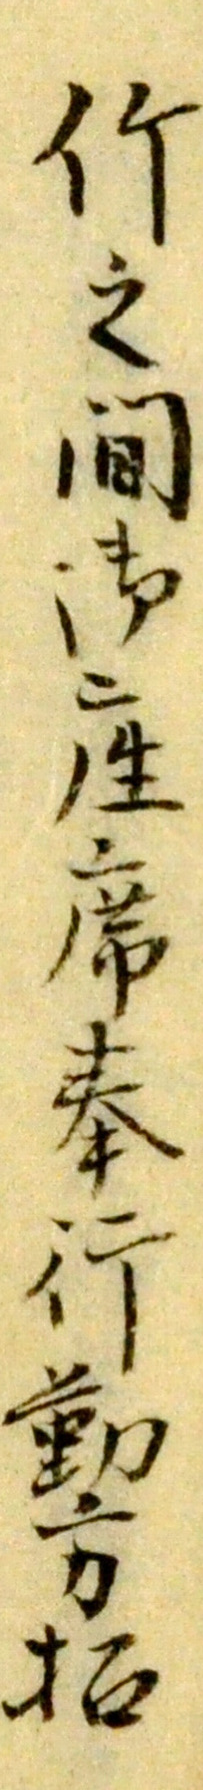竹之間御座席奉行勤方控
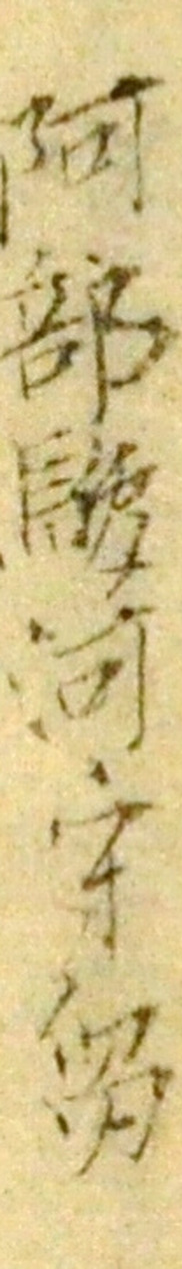阿部駿河守留

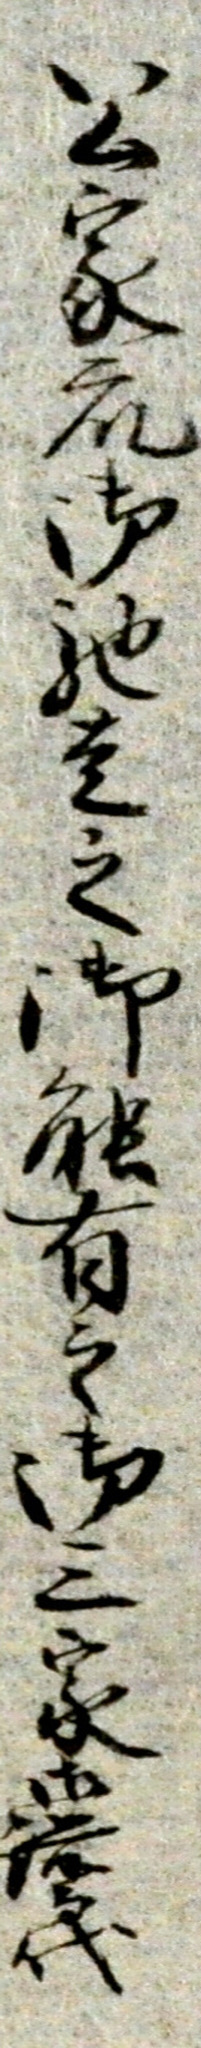公家衆御馳走之御能有之御三家御譜代
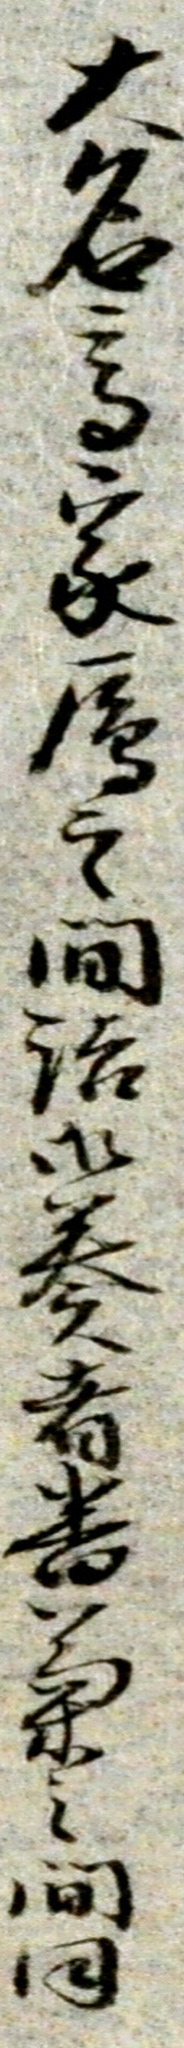大名高家雁之間詰御奏者番菊之間同
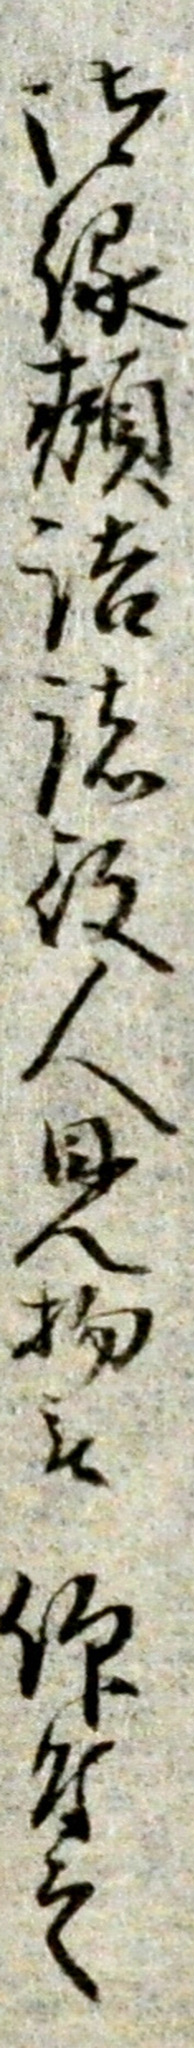御縁頬詰諸役人見物被仰付之
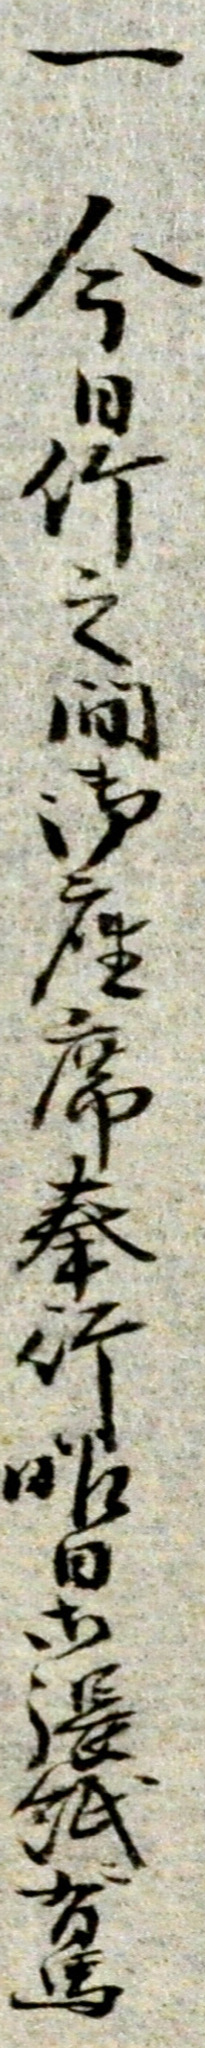一今日竹之間御座席奉行昨日御張紙ニ有馬
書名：竹ノ間御座席奉行勤方控外
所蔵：伊那市立高遠町図書館・合同会社AMANE
